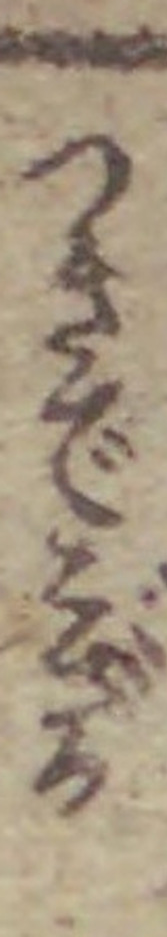つきでござる

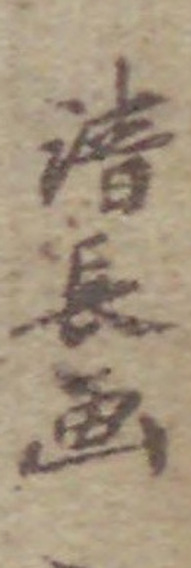清長画
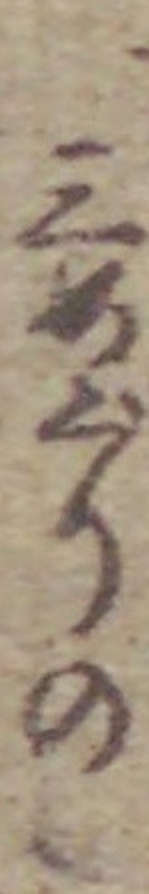三めぐりの
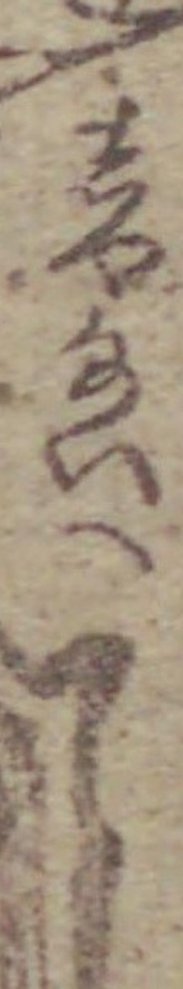しやないへ
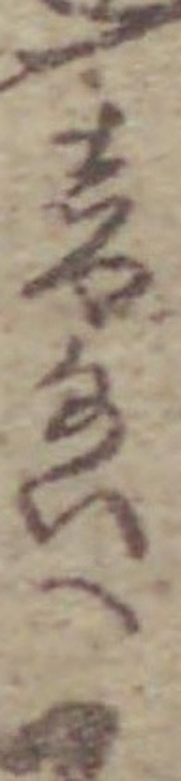しやないへ
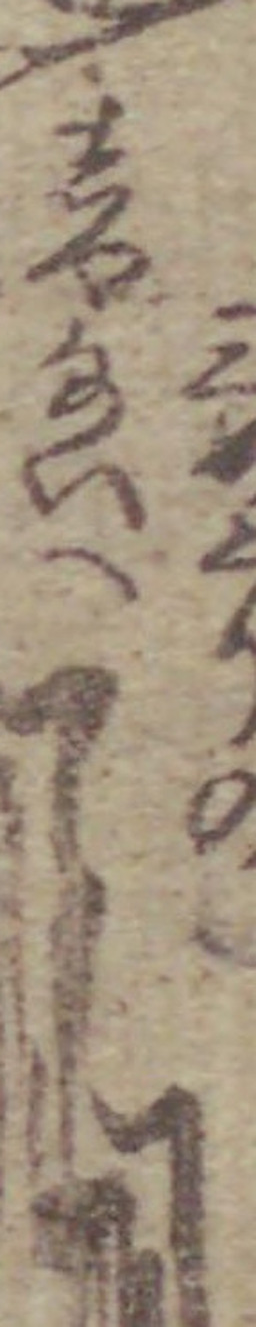しやないへ
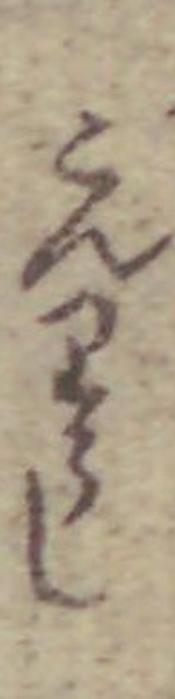こんりうし
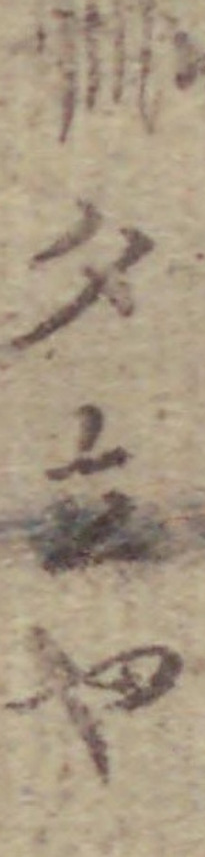夕立や
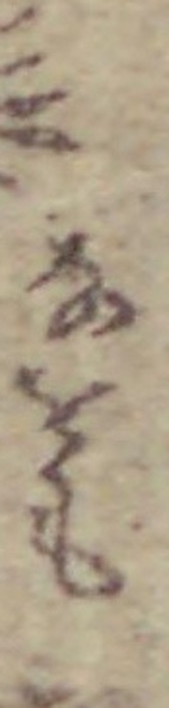なをも
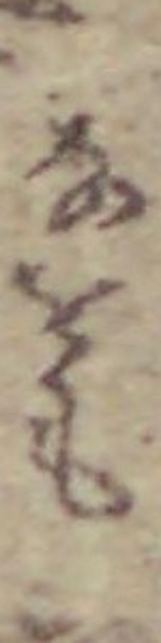なをも
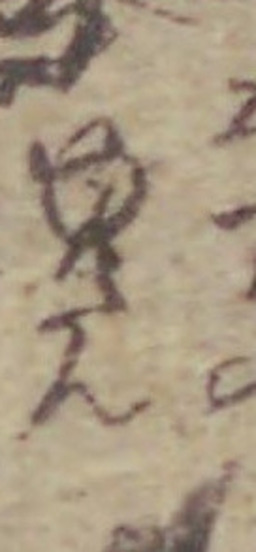ゆさん
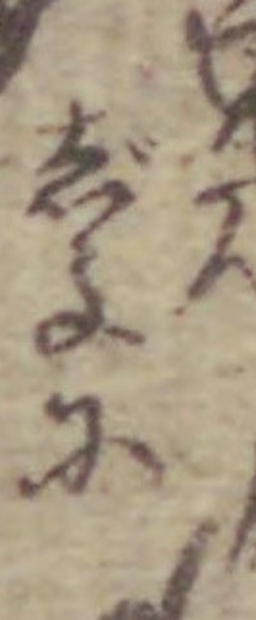じよに
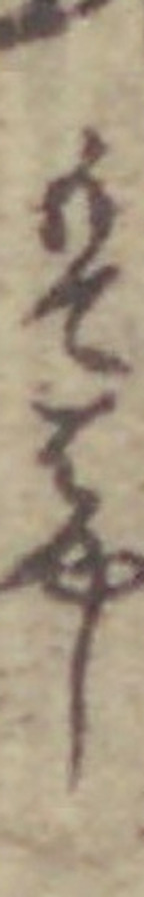もてはやし
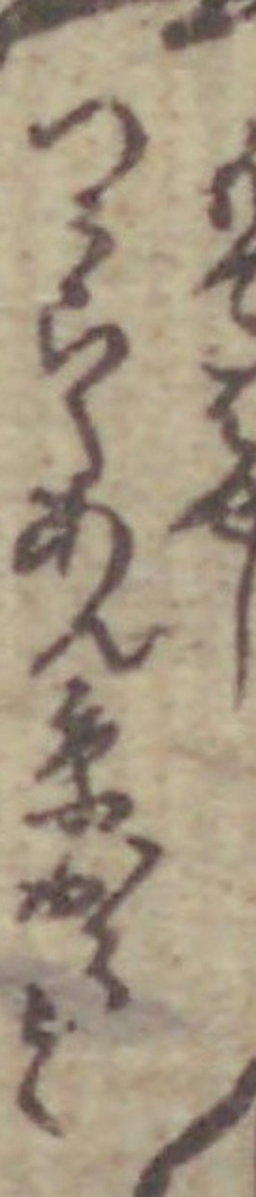つうらくあん京おうと
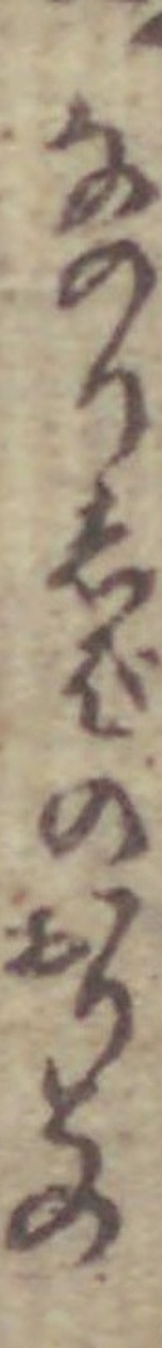なのりしばのおりとの
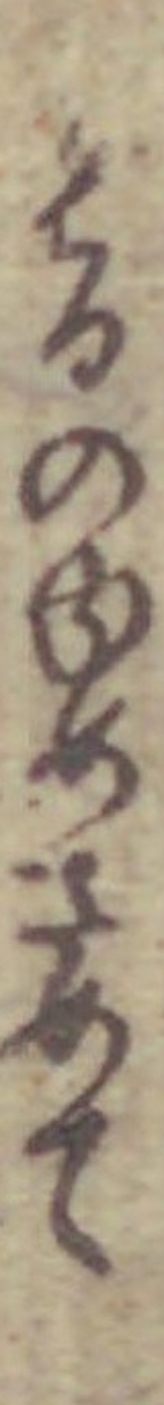はるのゆめさめて
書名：大通其面影 2巻
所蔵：国立国会図書館 National Diet Library, JAPAN
